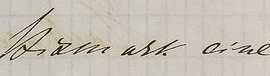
Hierauf ist nun
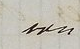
letzter
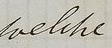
welche
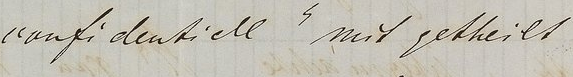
confidentiell» mitgetheilt
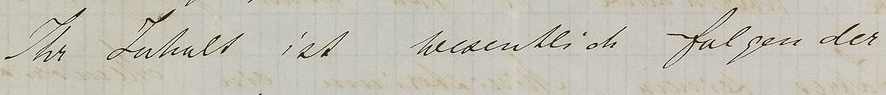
Ihr Inhalt ist wesentlich folgender:
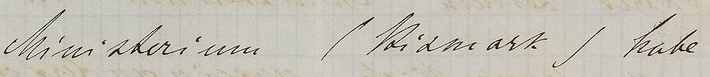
Ministerium (Bismark) habe
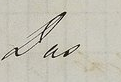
dem
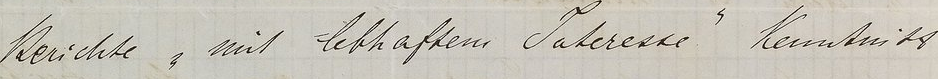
Berichte «mit lebhaftem Interesse» Kenntniss
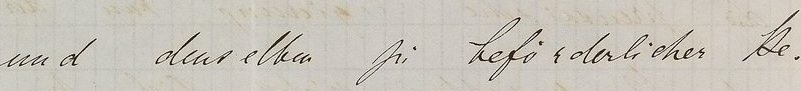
und denselben zu beförderlicher Be-
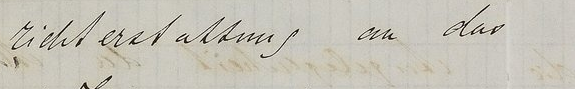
richterstattung an das
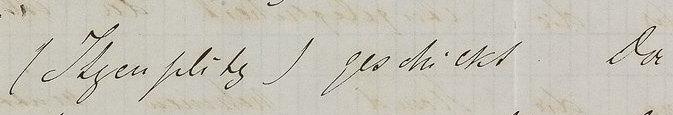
( Itzenplitz ) geschickt. Der
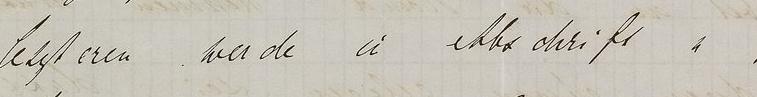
letzteren werde in Abschrift «zu
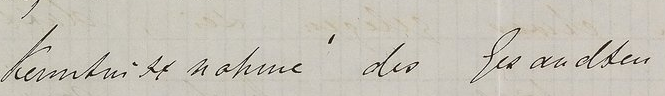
Kenntnissnahme» des Gesandten
